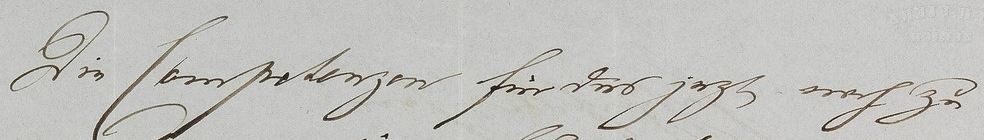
Die Competenzen für das jezt noch zu
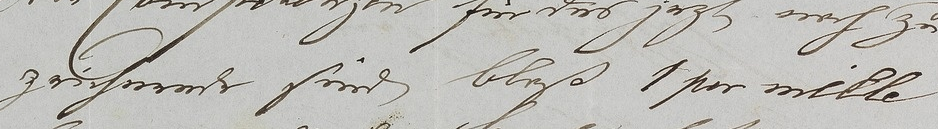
zeichnende sind bloß 1 pro mille
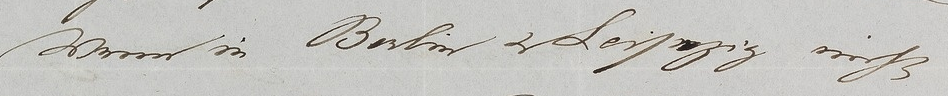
Wenn in Berlin & Leipzig nicht
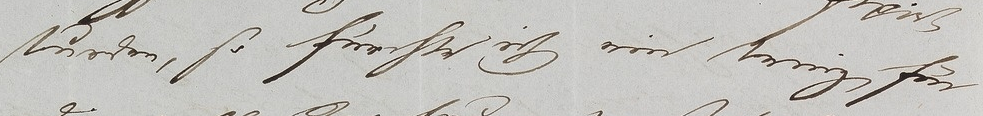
wurden, so fürchte ich ein wenig für
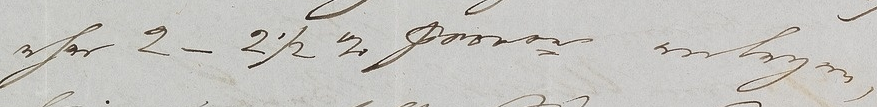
eher 2–2½% Provon anlegen,
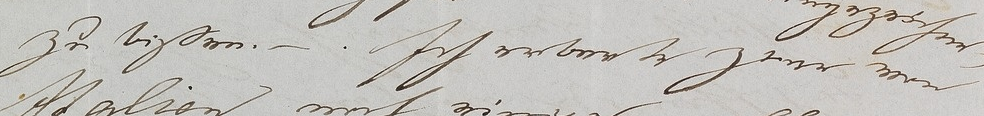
zu wißen. Ich erwarte zwar von
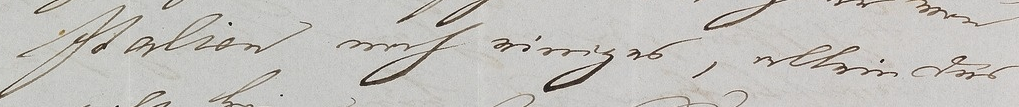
Italien noch einiges, allein das
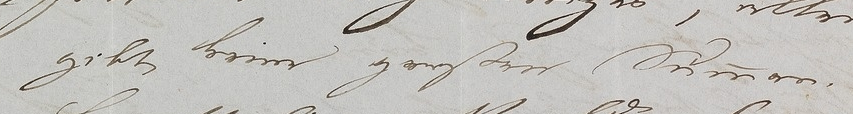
gibt keine großen Summen. –
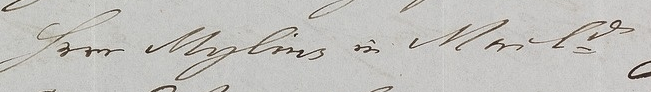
Herr Mylius in Maild
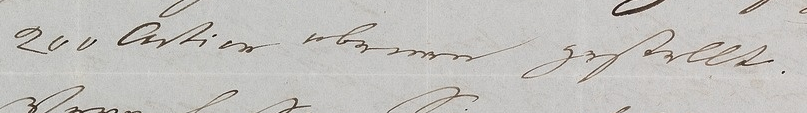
200 Actien obenan gestellt.
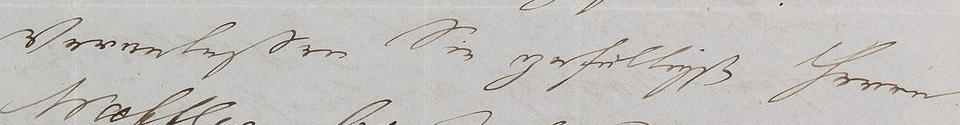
Veranlaßen Sie gefälligst Herrn
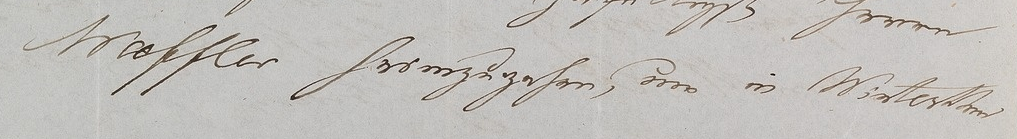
Wäffler heimzugehen, um in Winterthur
